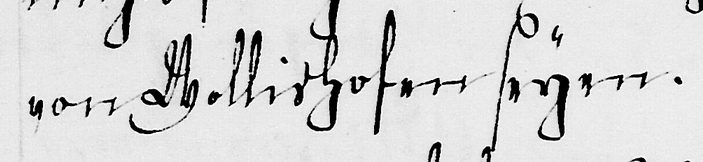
von Wollishofen seyen.
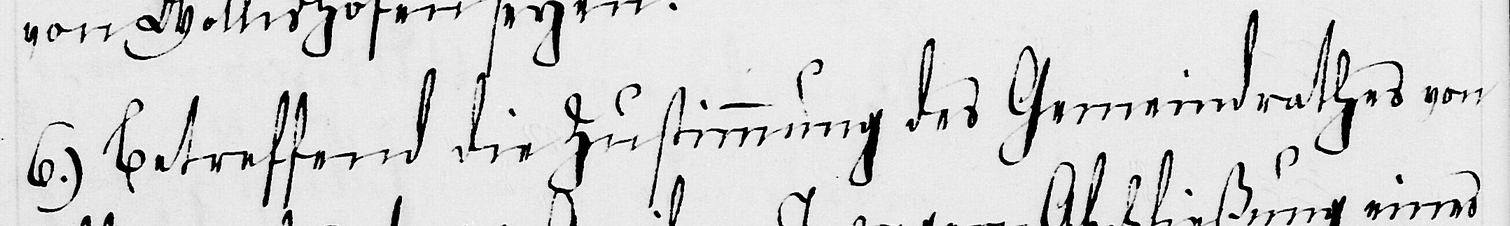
6.) Betreffend die Zustimmung des Gemeindrathes von
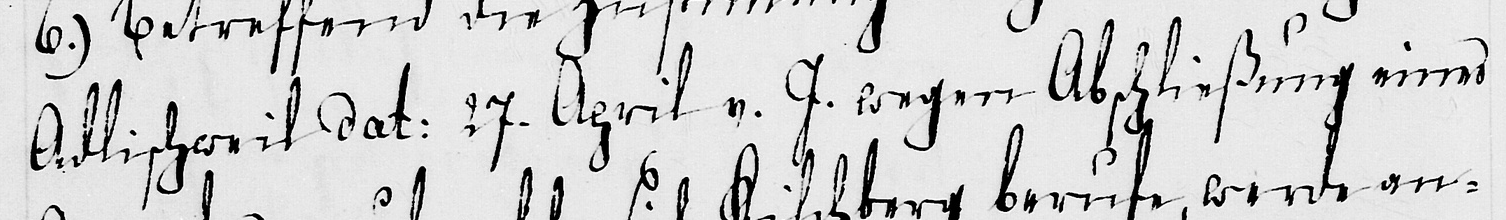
Adlischweil dat: 27. April v. J. wegen Abschließung eines
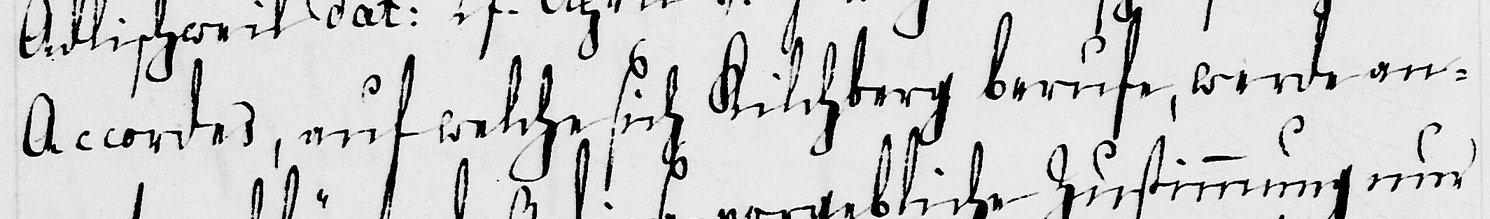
Accordes, auf welche sich Kilchberg berufe, werde an¬
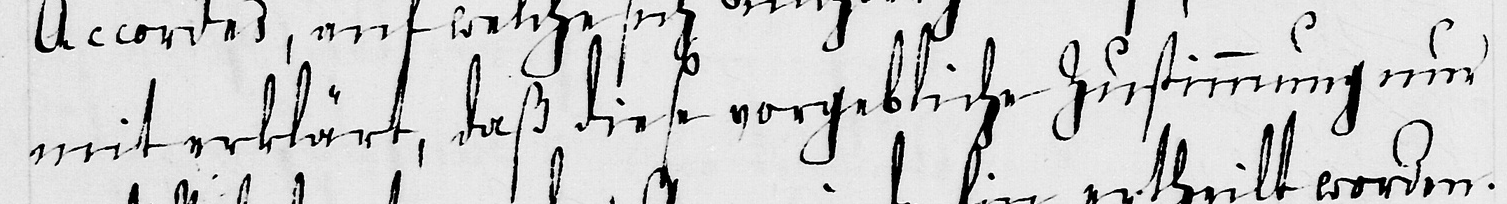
mit erklärt, daß diese vorgebliche Zustimmung nur
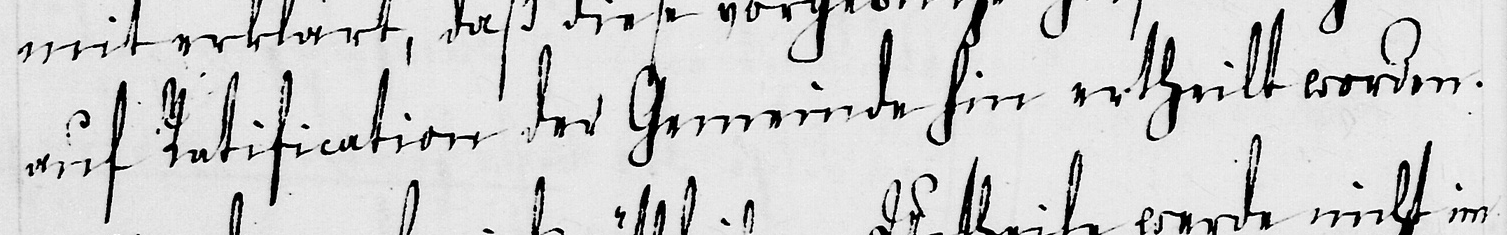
auf Ratification der Gemeinde hin ertheilt worden.
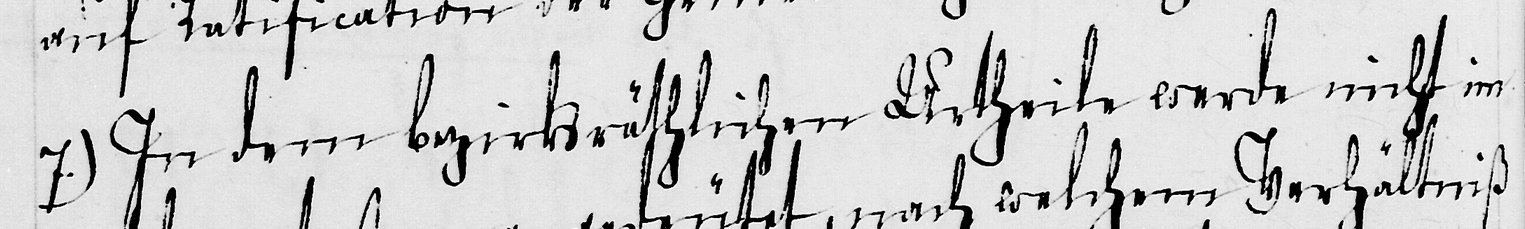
7.) In dem bezirksräthlichen Urtheile wurde nicht im
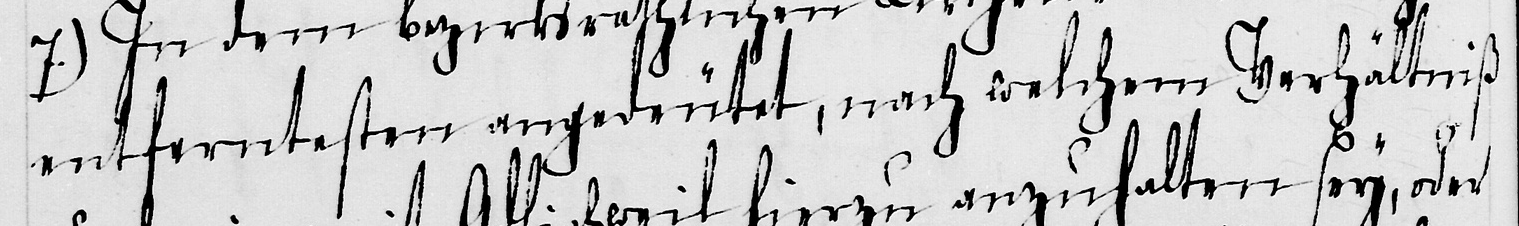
entferntesten angedeutet, nach welchem Verhältniß
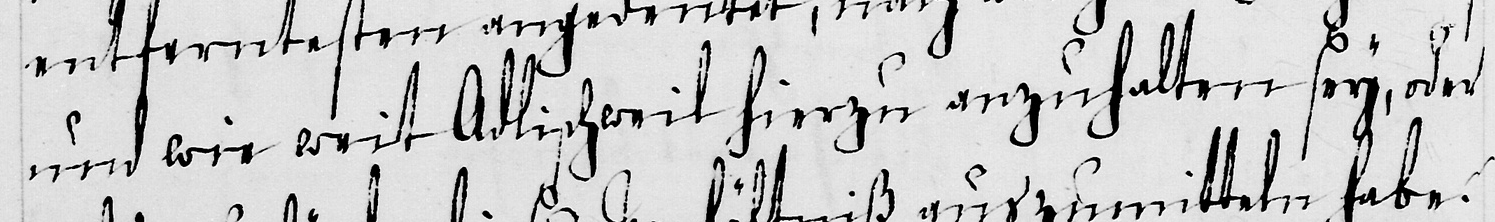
und wie weit Adlischweil hierzu anzuhalten sey, oder
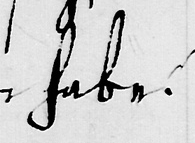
habe.
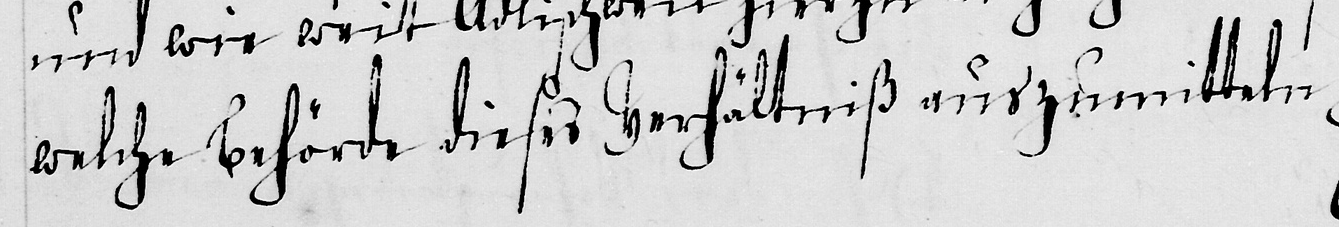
welche Behörde dieses Verhältniß auszumitteln
